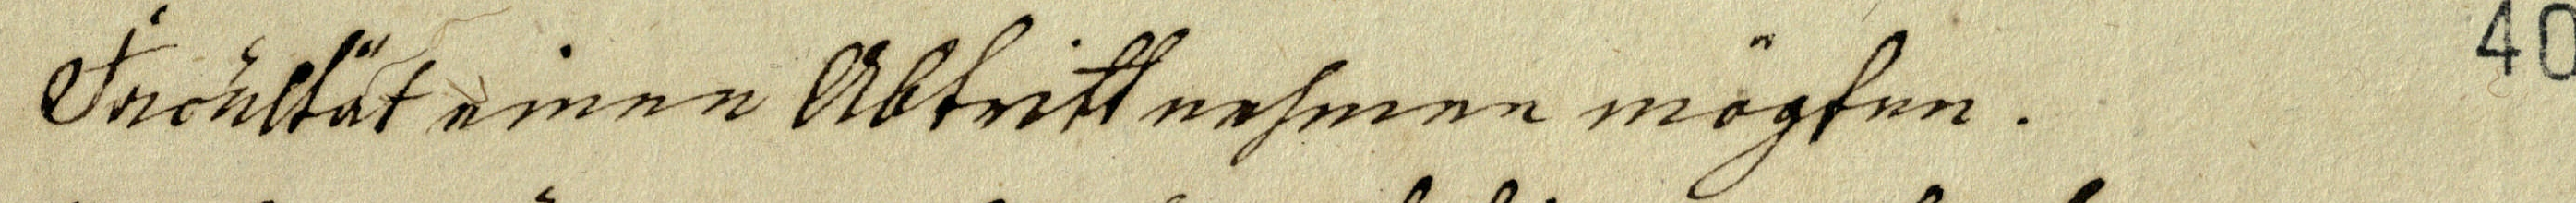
Facultät einen Abtritt nehmen mögten.
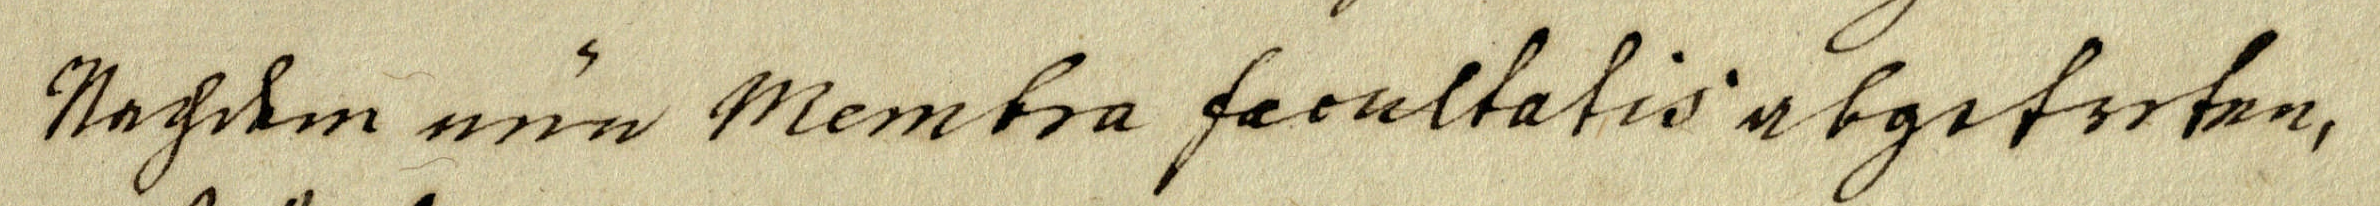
Nachdem nun Membra facultatis abgetreten,
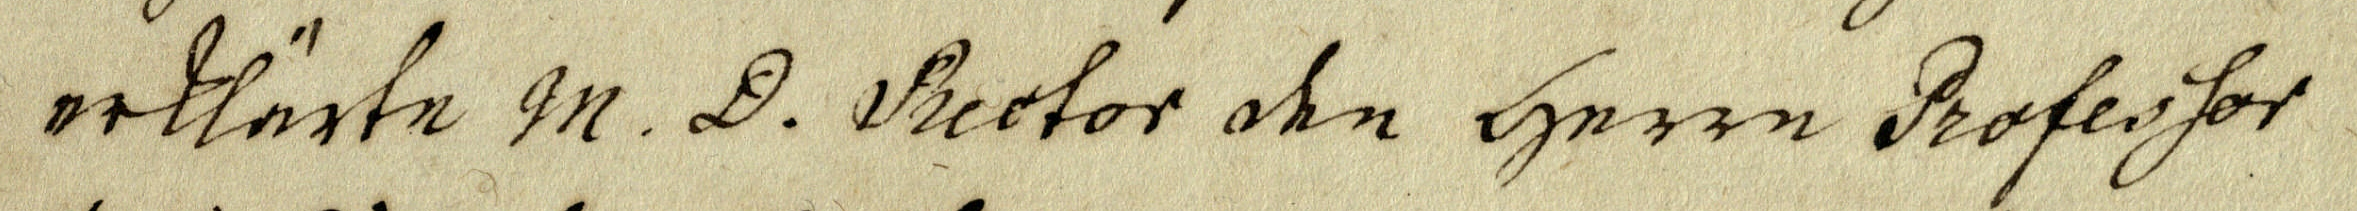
erklärte M. D. Rector den Herrn Professor
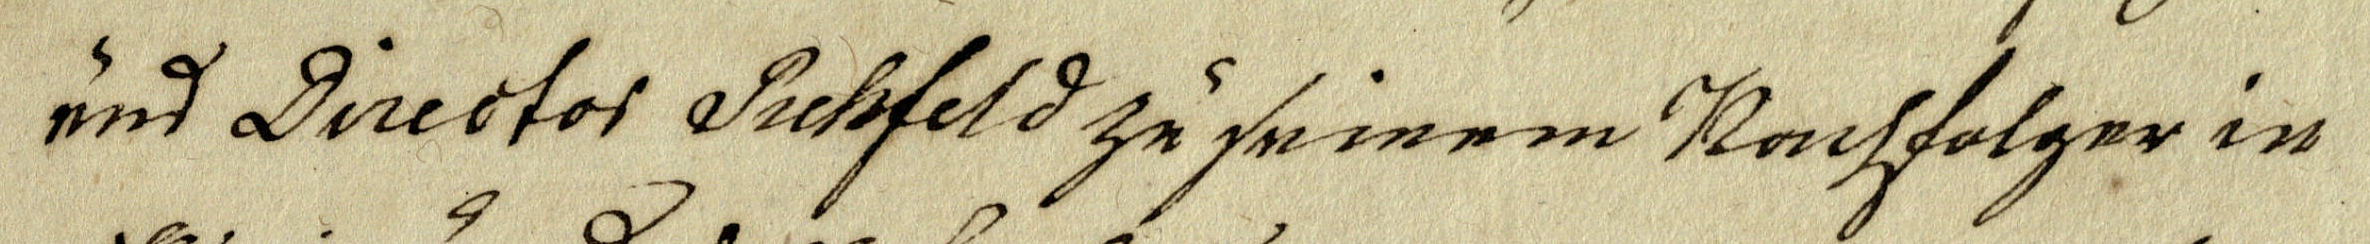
und Director Rehfeld zu seinem Nachfolger in
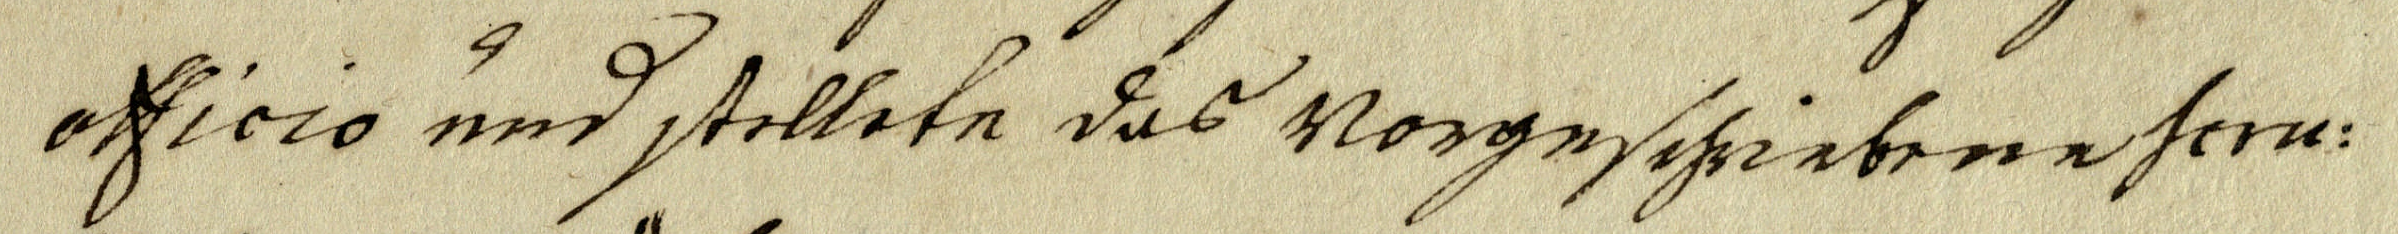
officio und stellete das vorgeschriebene scru¬
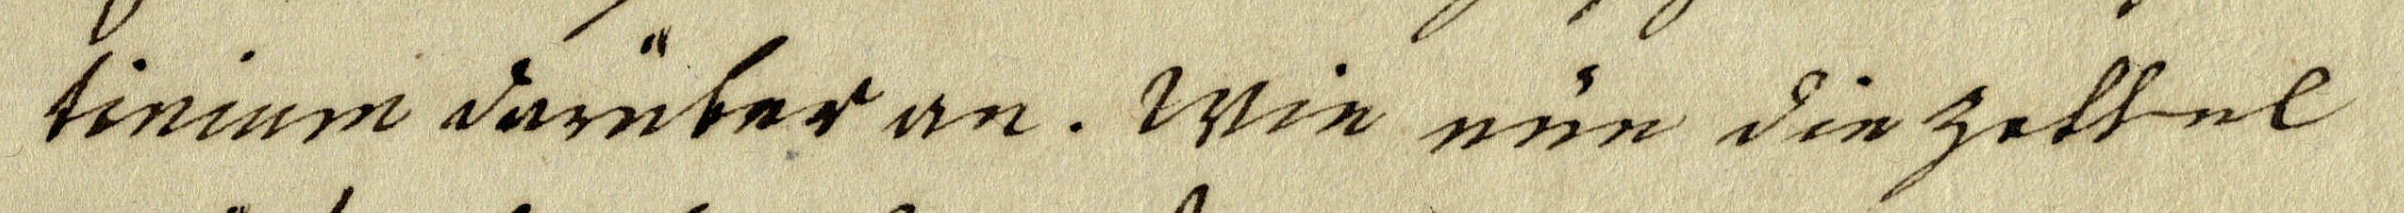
tinium darüber an. Wie nun die Zettel
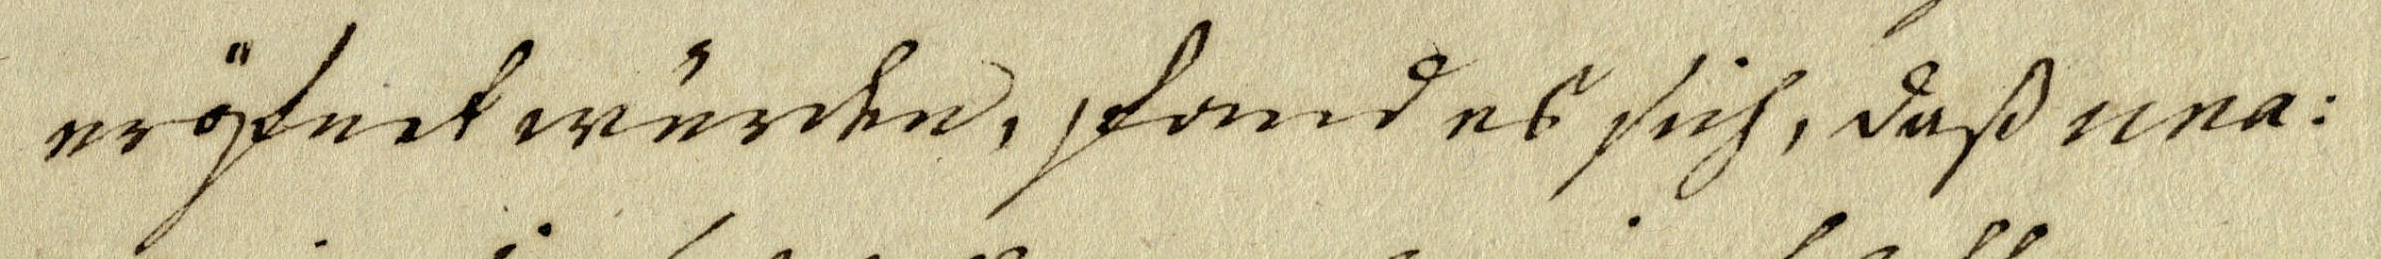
eröfnet wurden, fand es sich, daß una¬
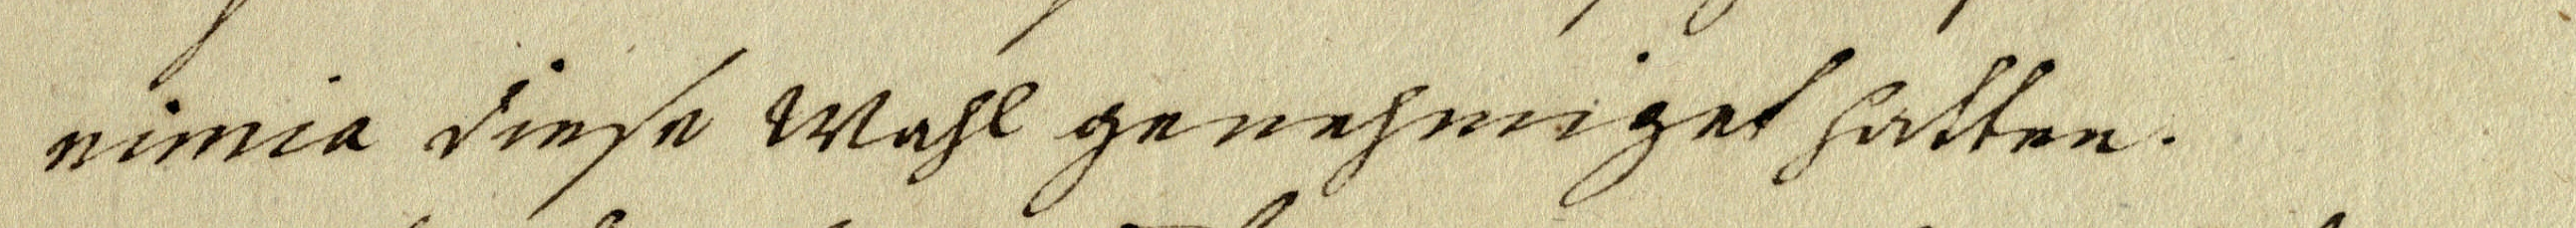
nimia diese Wahl genehmiget hatten.
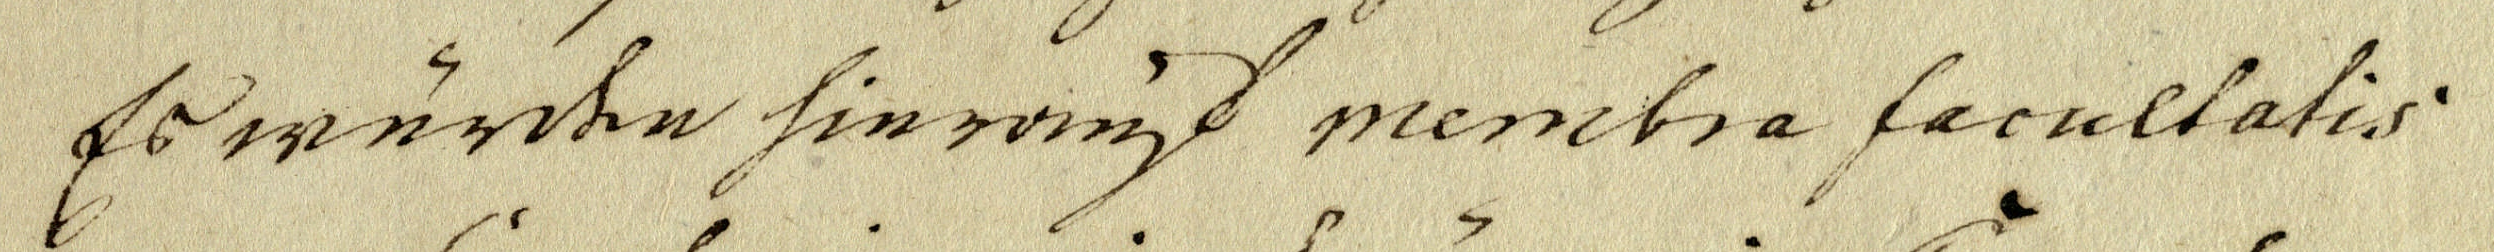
Es wurden hierauf membra facultatis
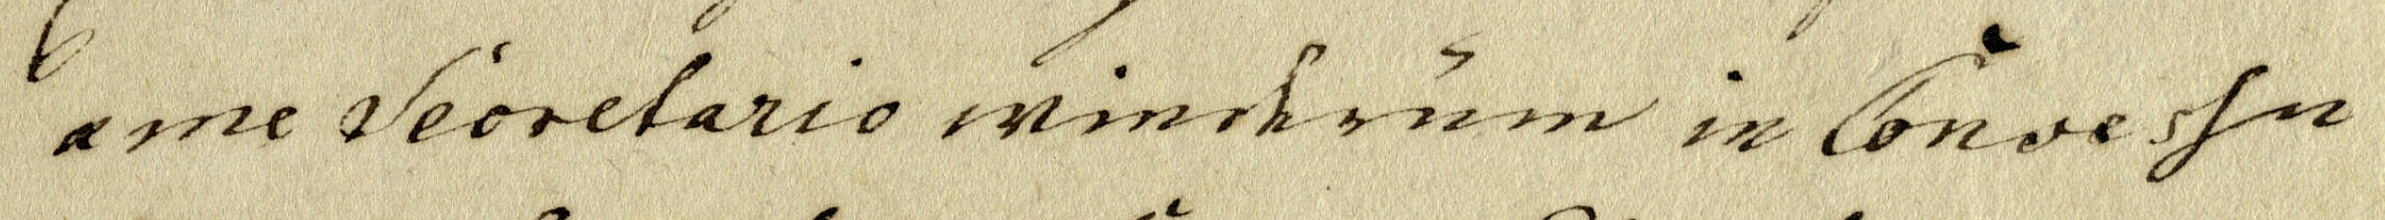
a me Secretario wiederum in Consessu
